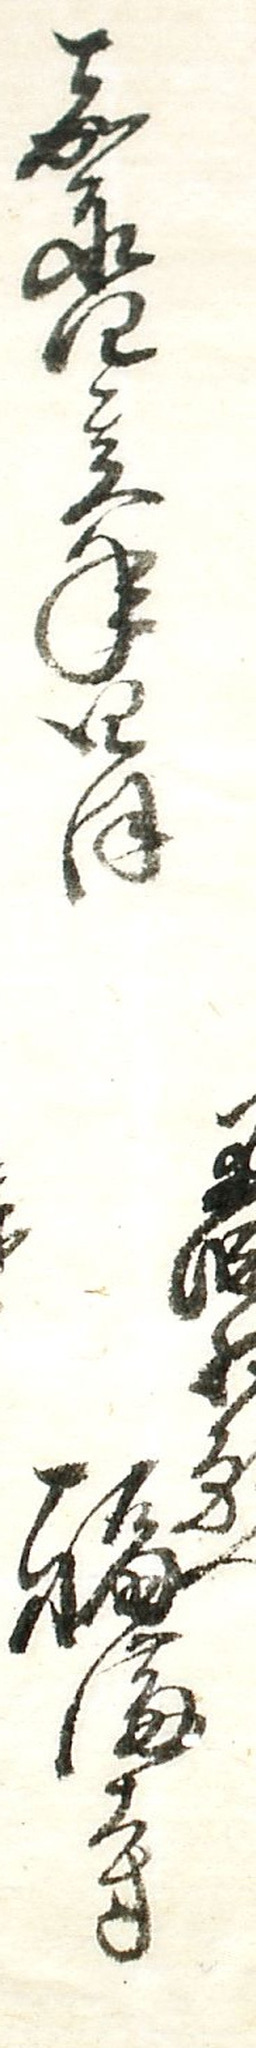嘉永四亥年四月福満寺
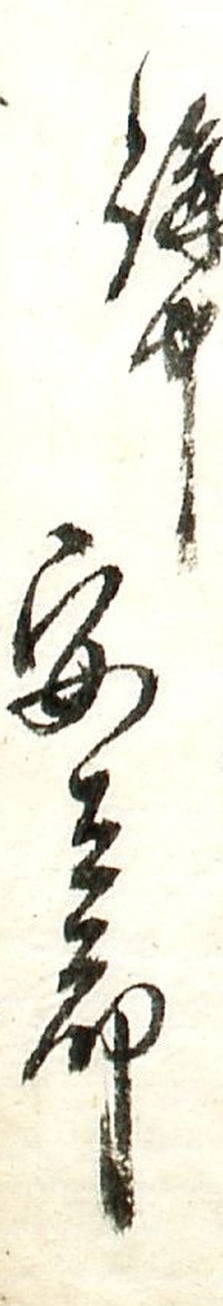安太郎
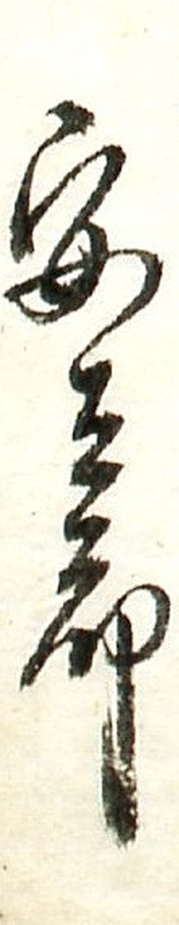安太郎
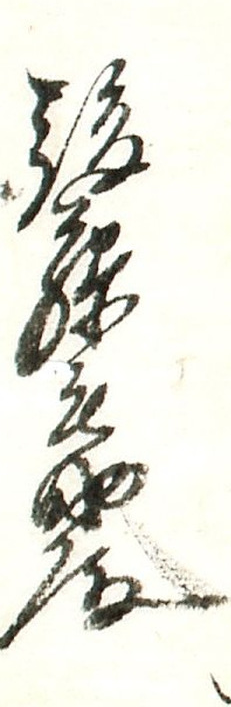後藤庄助殿
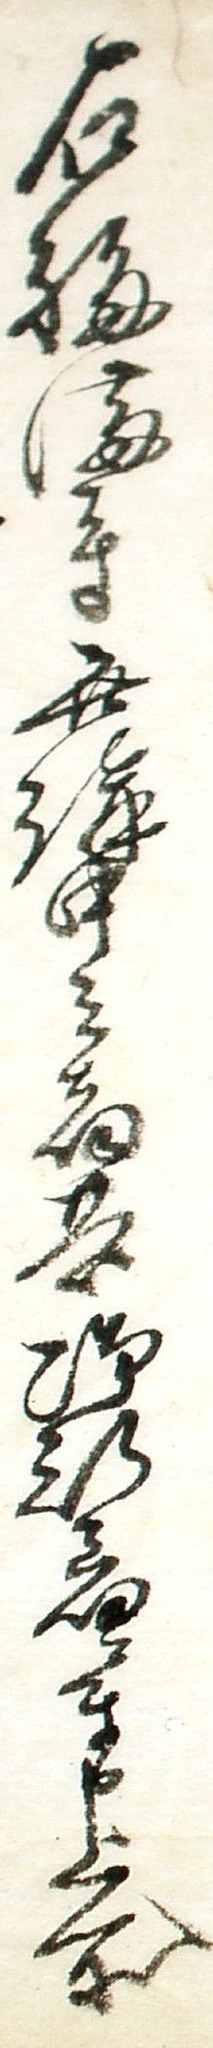右福満寺幷講中之者共御行着ニ付申上所
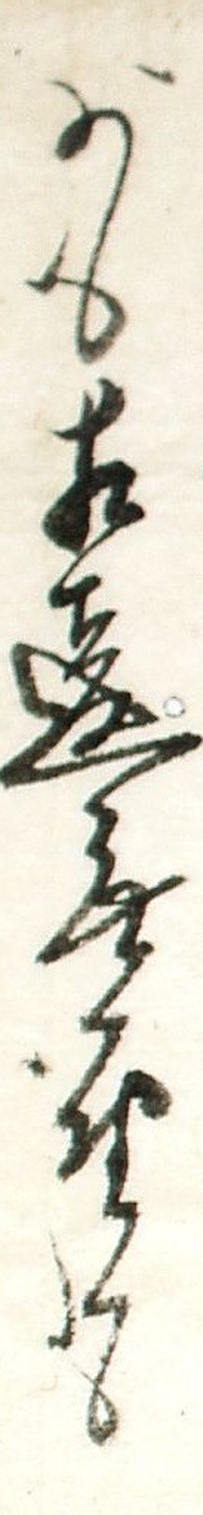少も相違無御坐候以上
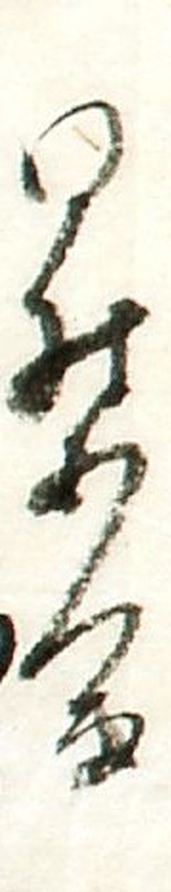同村五人与
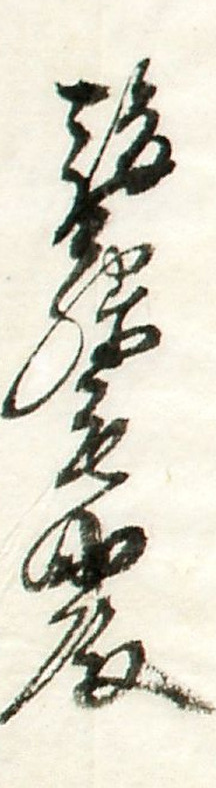後藤庄助殿

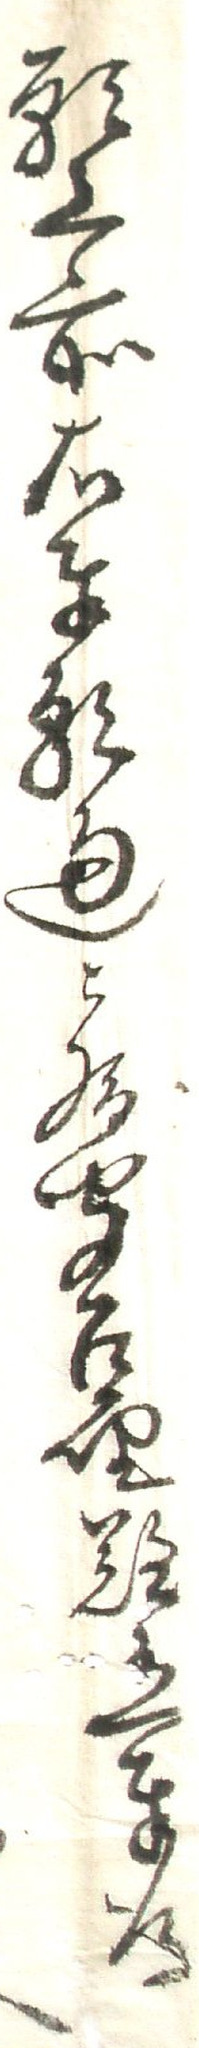願上候所右奉願通被為聞召届難有奉存
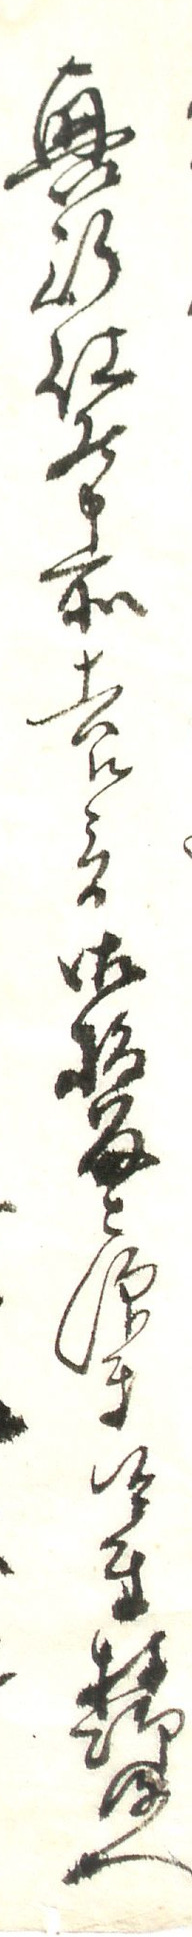興行仕居申所去ル三日御指留被仰付候ニ付村御役人
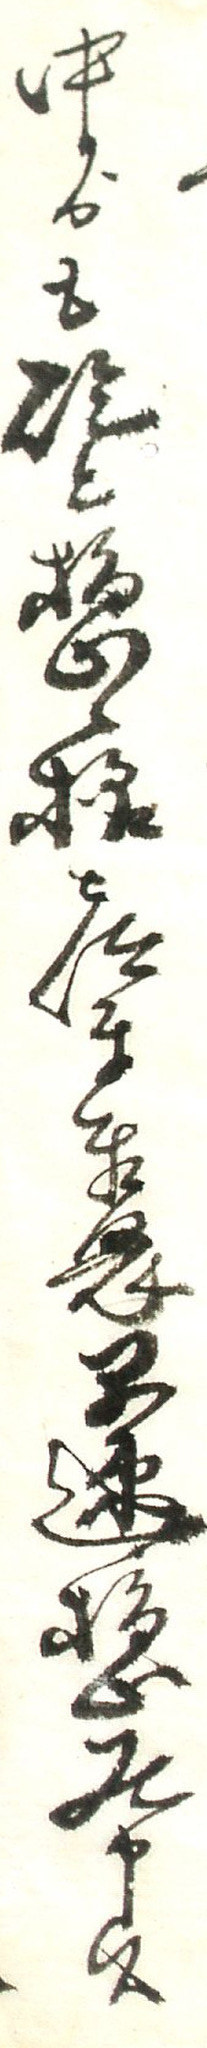中ゟも屹と指止候様被仰付奉畏早速指止居申候
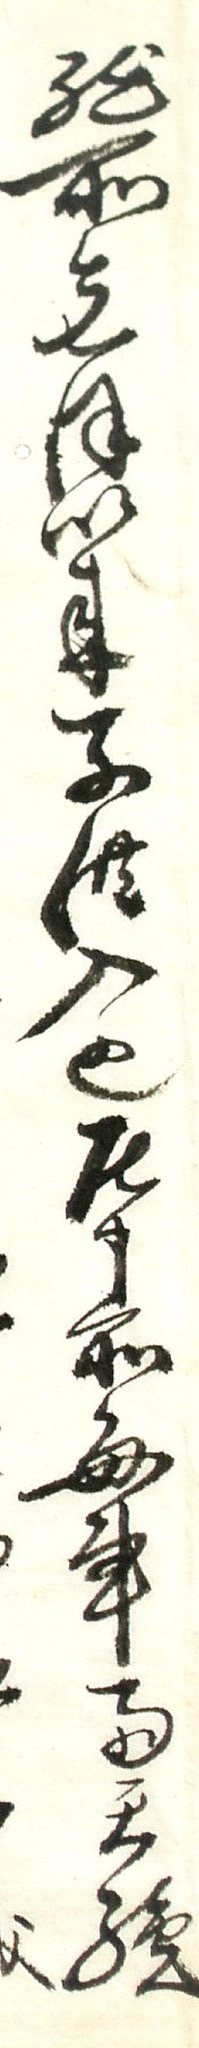然所先月以来子供入込居申所毎事雨天續
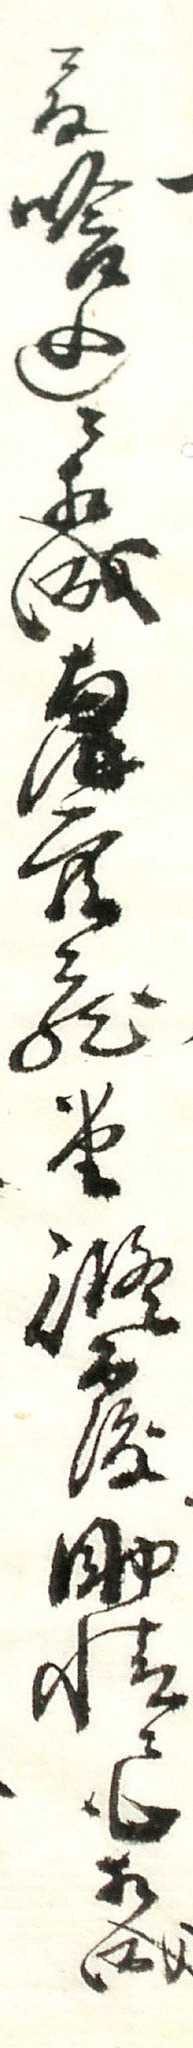ニ而喰込ニ相成虚空蔵堂修覆助情ニも相成
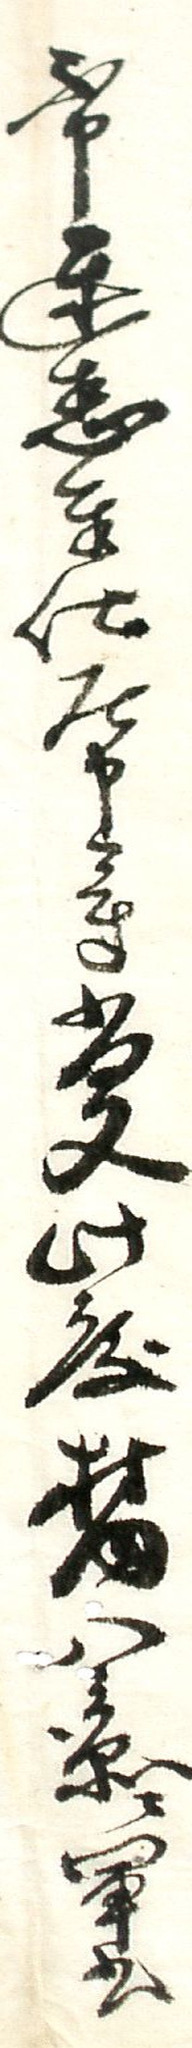不申迷惑奉仕居申ニ付尚又此度村内八兵衛ニ軍書
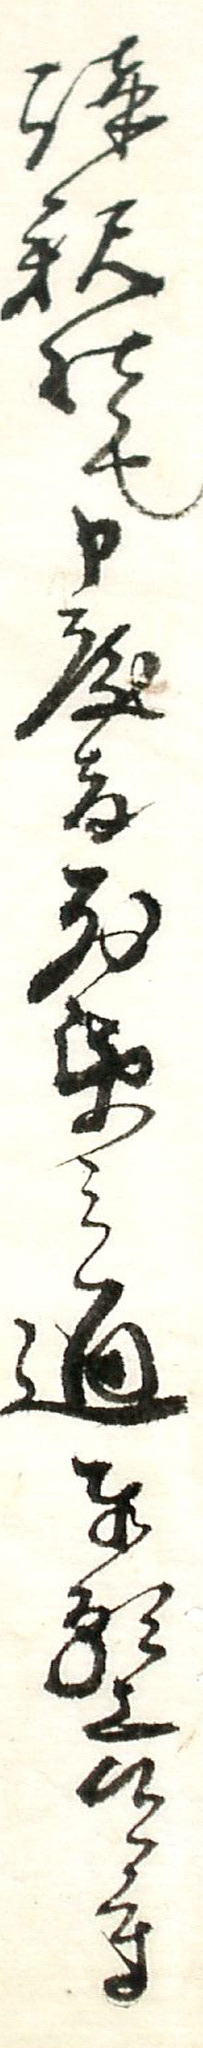講釈仕せ申度旨別帋之通奉願上候ニ付
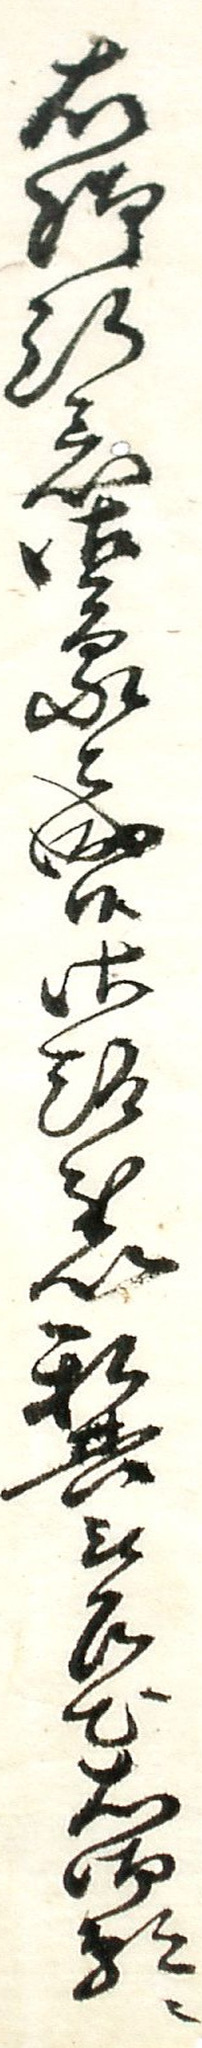右御行着御蒙ニ成候御趣を以私共被召出右御願ニ
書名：(早渕村福満寺子ども浄瑠璃願紙面）他
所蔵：鳴門教育大学 Naruto University of Education
